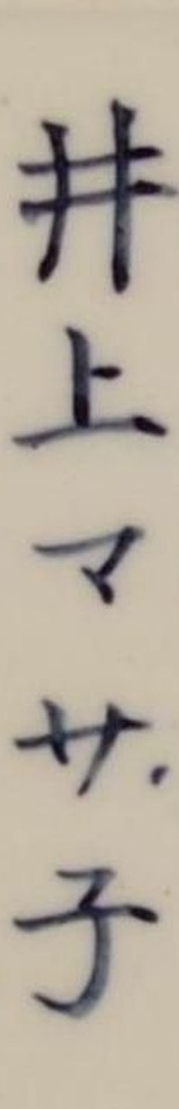井上マサ子
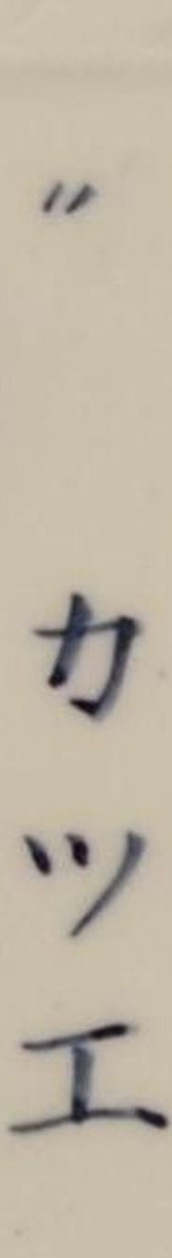カツエ
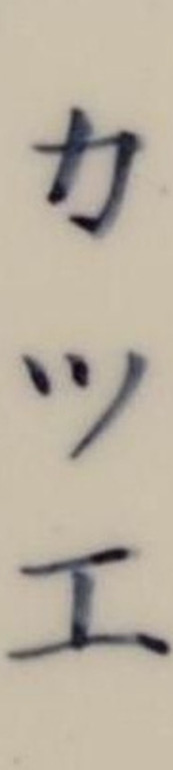カツエ
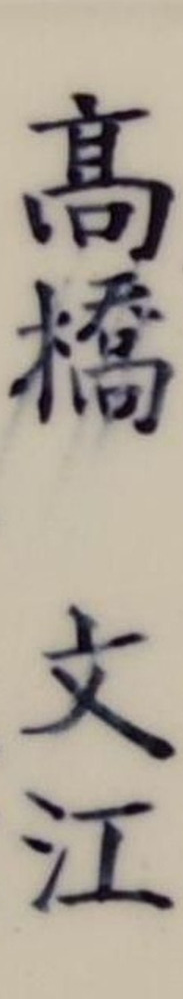高橋文江
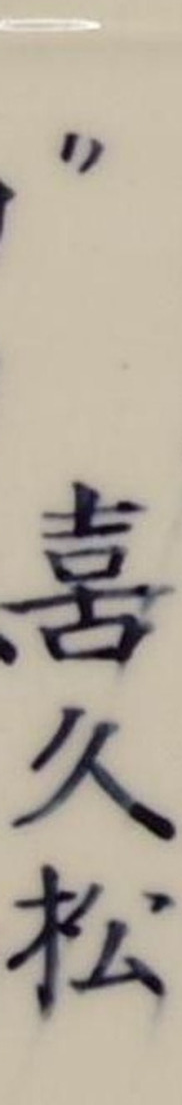喜久松
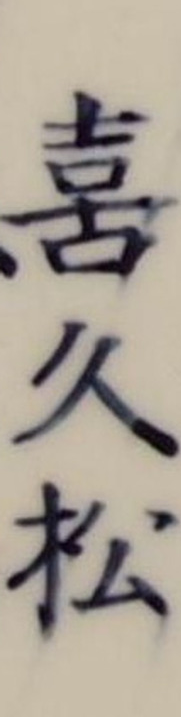喜久松
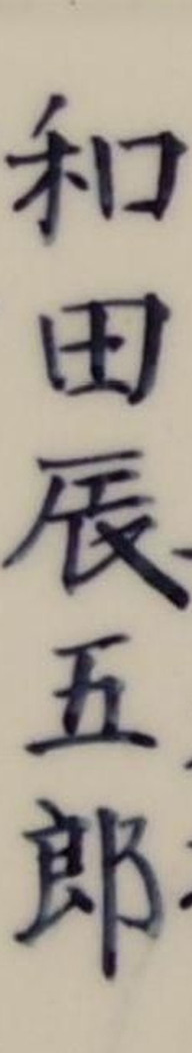和田辰五郎
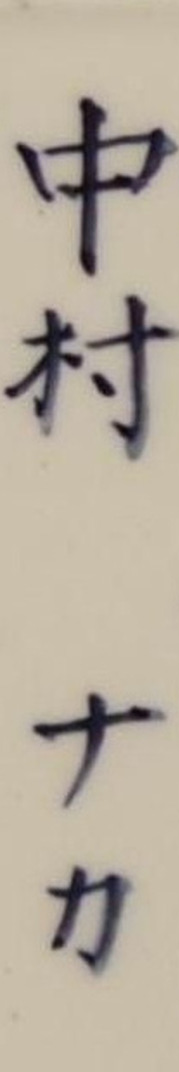中村ナカ
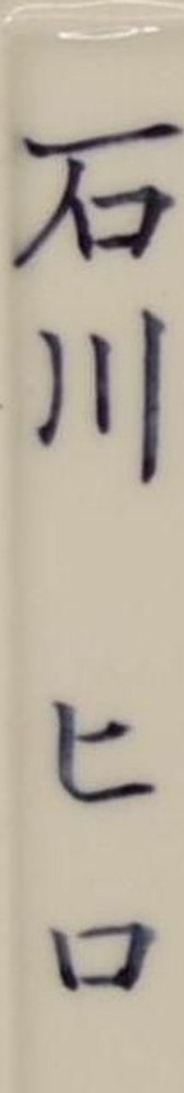石川ヒ口

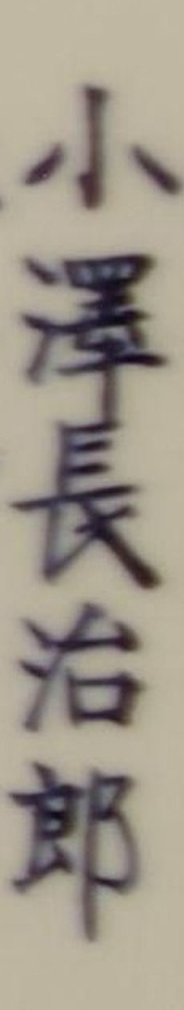小澤長治郎
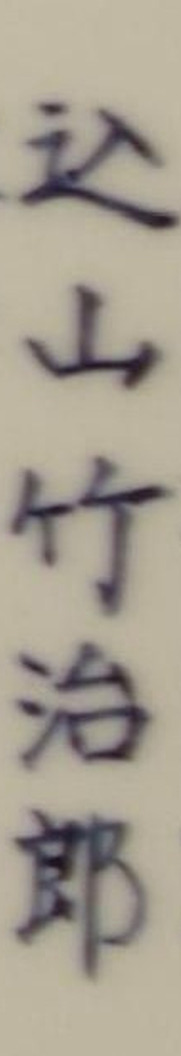込山竹治郎
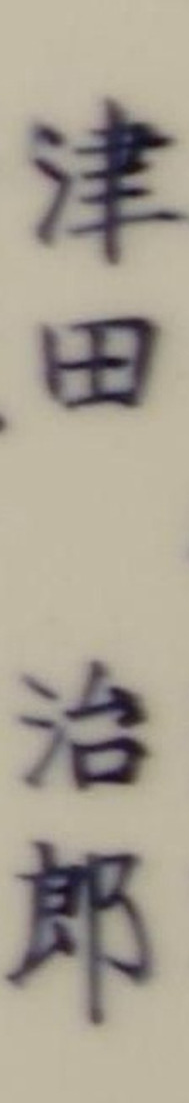津田治郎
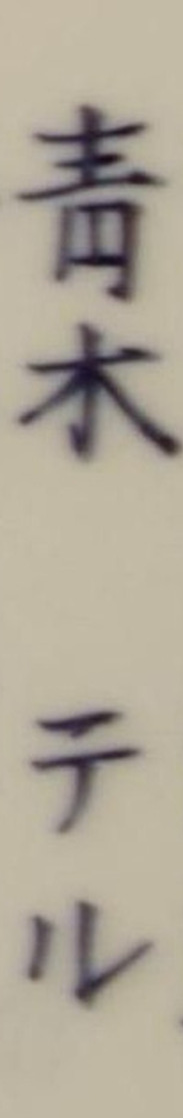青木テル
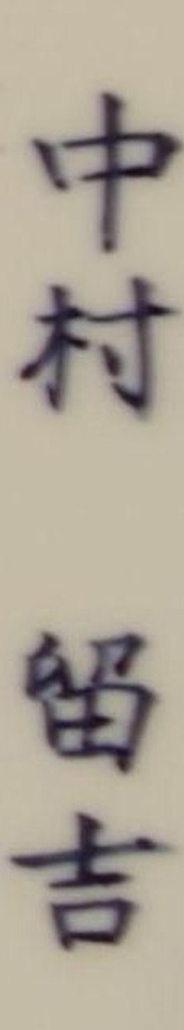中村留吉
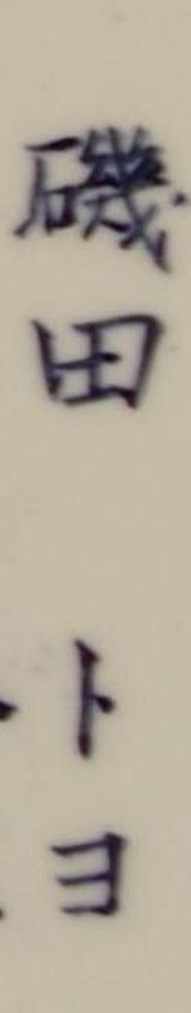磯田トヨ
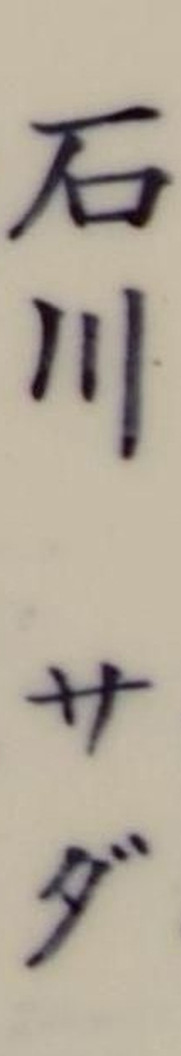石川サダ
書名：E~L
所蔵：高野山金剛峯寺
